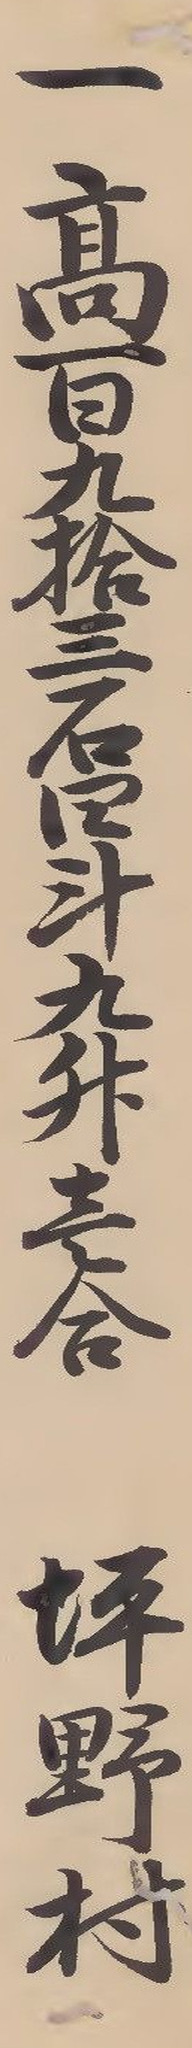一高百九拾三石四斗九升壱合坪野村
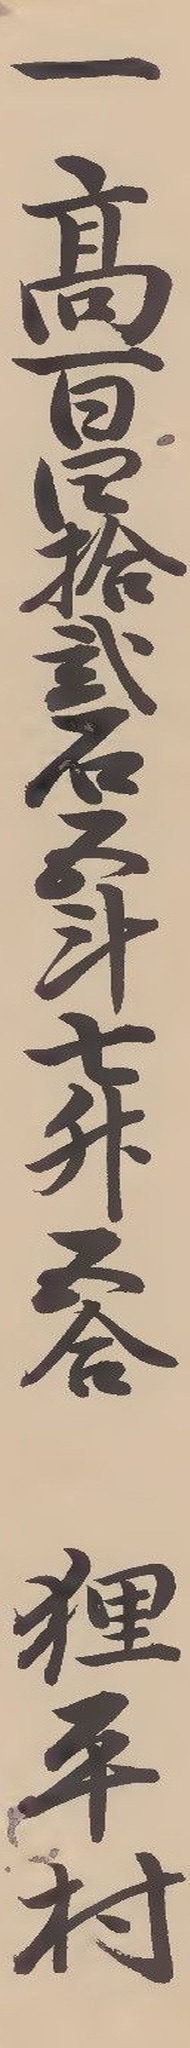一高百四拾弐石五斗七升五合狸平村
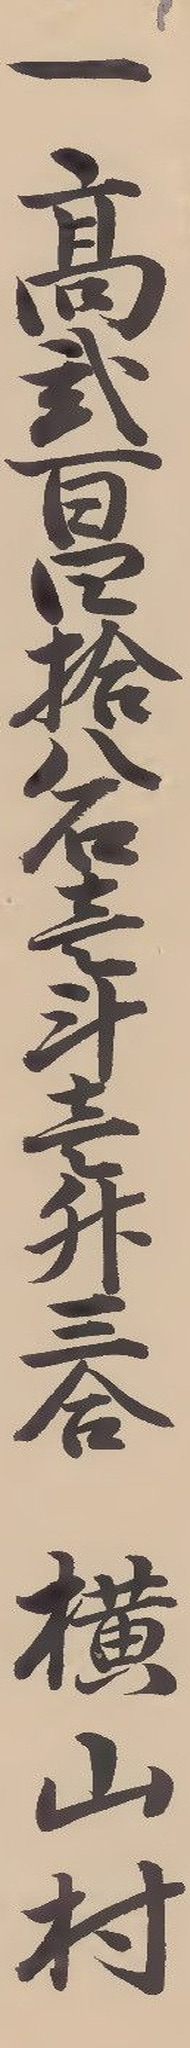一高弐百四拾八石壱斗壱升三合横山村
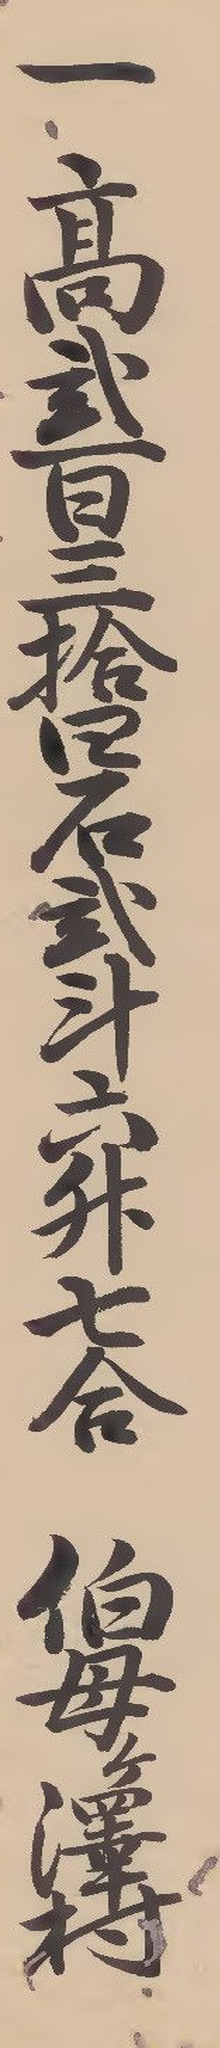一高弐百三拾四石弐斗六升七合伯母ヶ沢村

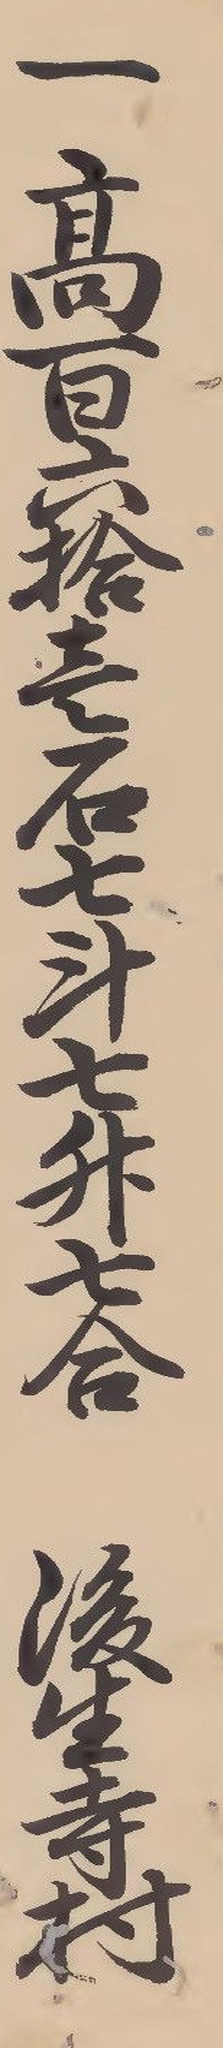一高百六拾壱石七斗七升七合後生寺村
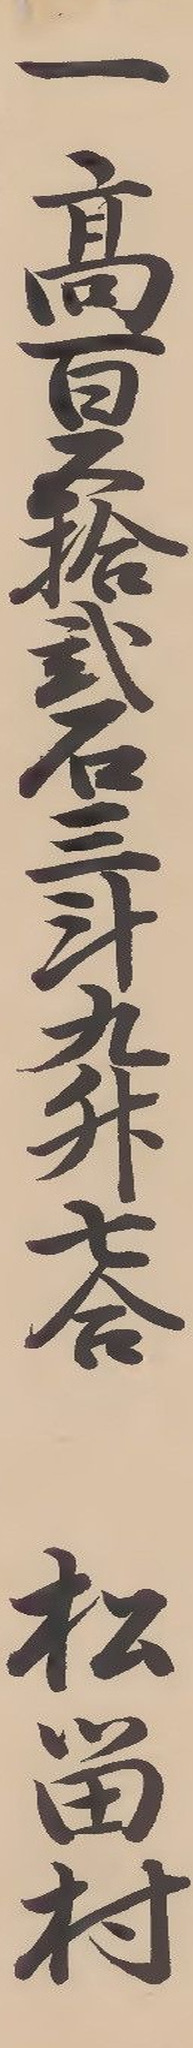一高百五拾弐石三斗九升七合松留村
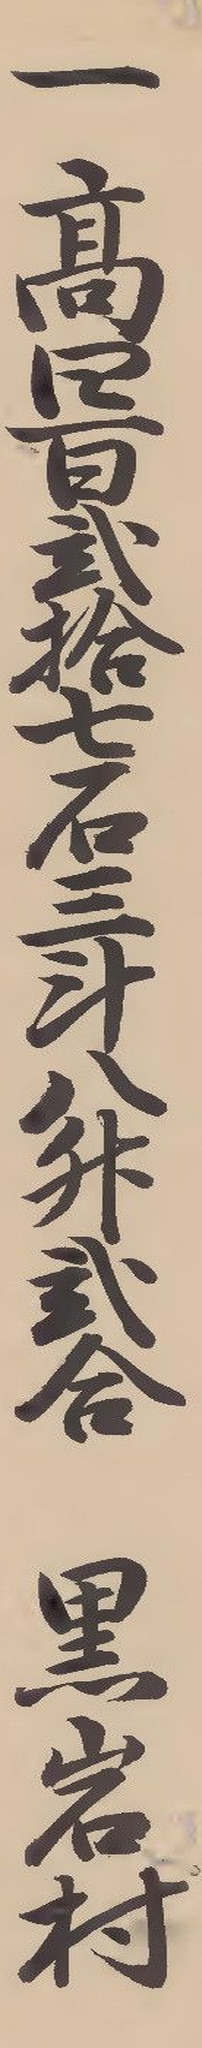一高四百弐拾七石三斗八升弐合黒岩村
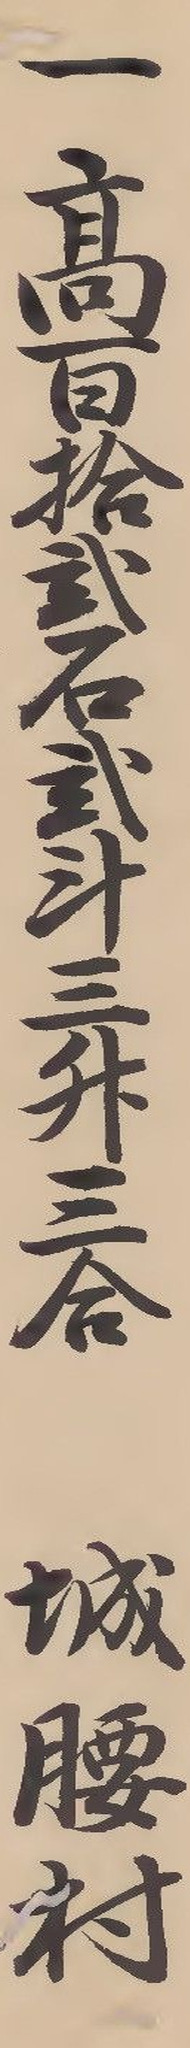一高百拾弐石弐斗三升三合城腰村
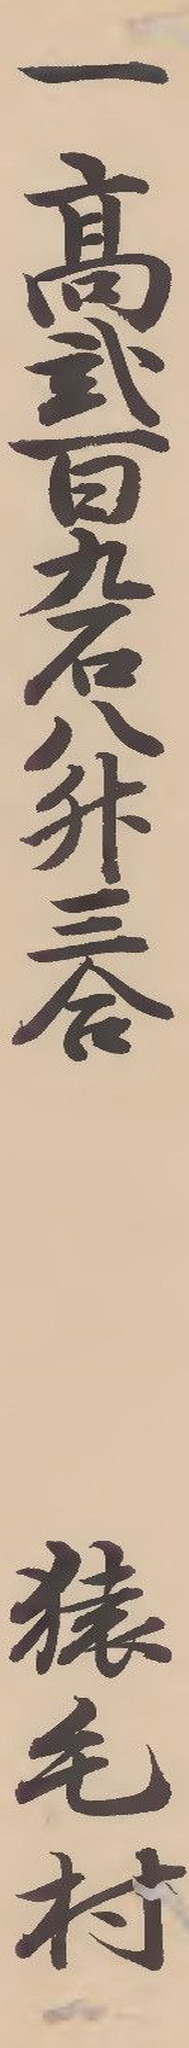一高弐百九石八升三合猿毛村
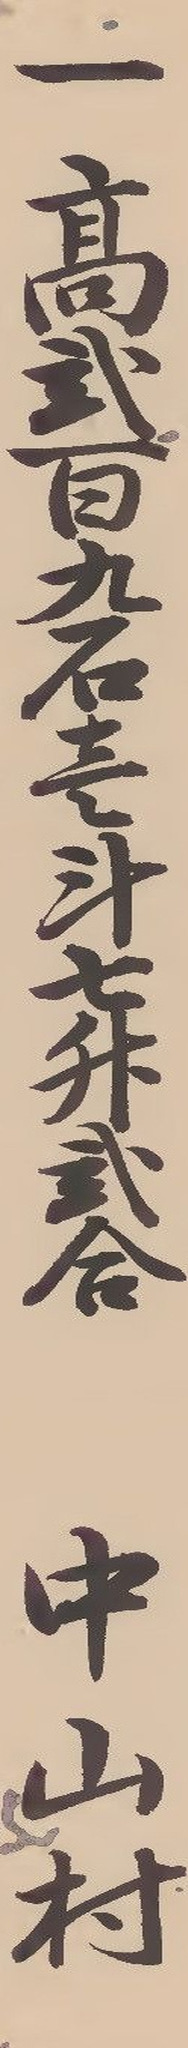一高弐百九石壱斗七升弐合中山村
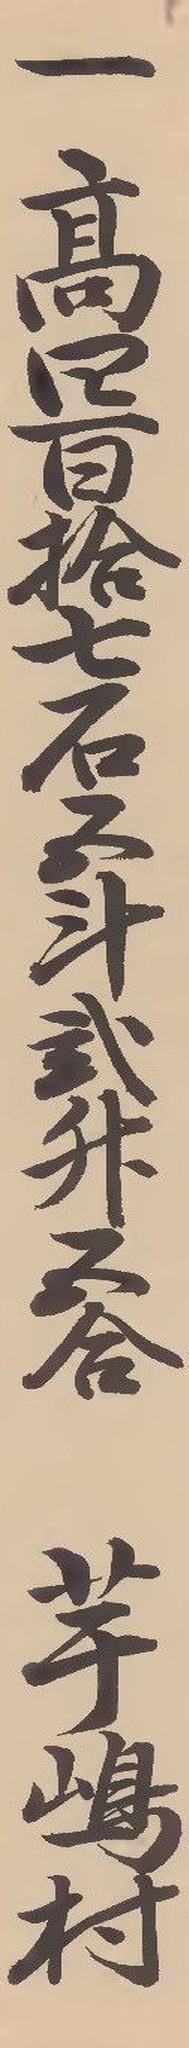一高四百拾七石五斗弐升五合芋島村
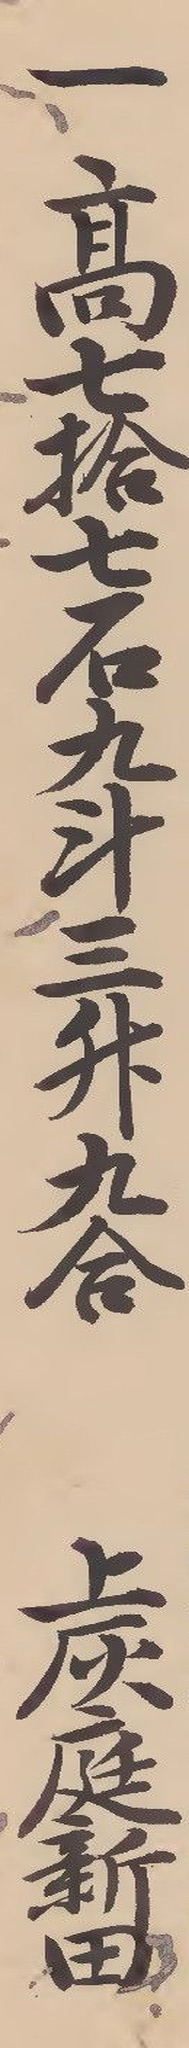一高七拾七石九斗三升九合上灰庭新田

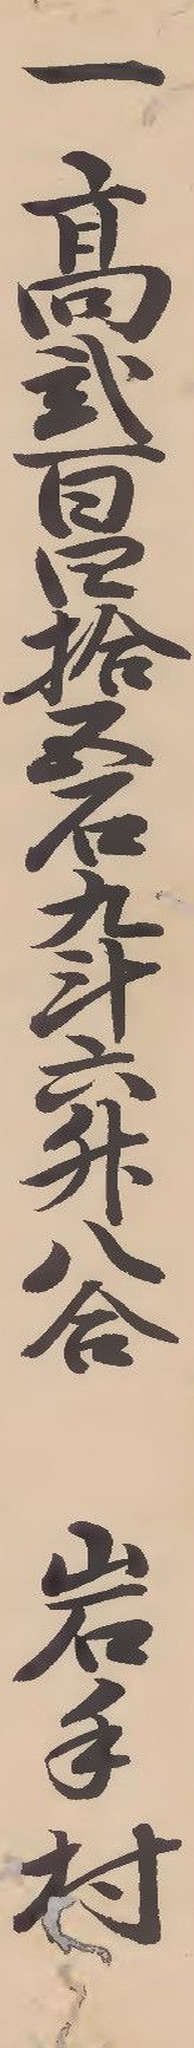一高弐百四拾五石九斗六升八合岩手村
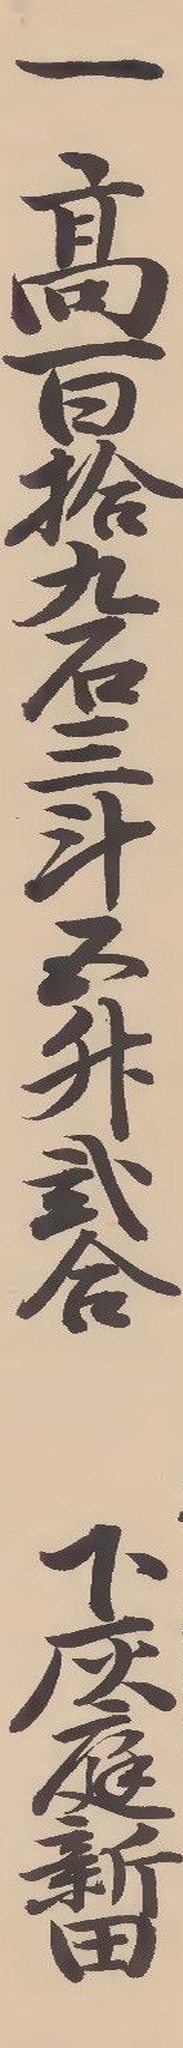一高百拾九石三斗五升弐合下灰庭新田
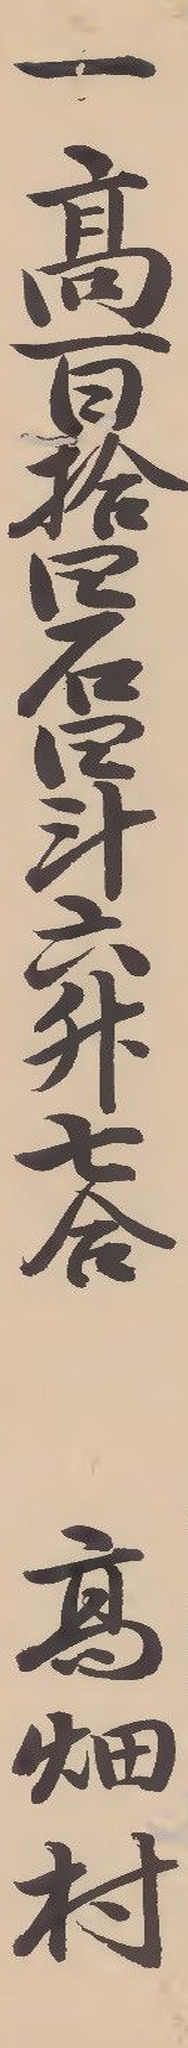一高百拾四石四斗六升七合高畑村
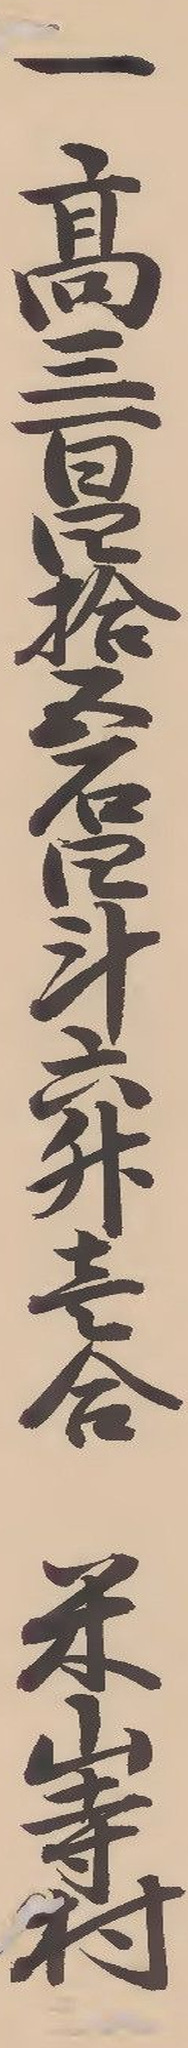一高三百四拾五石四斗六升壱合米山寺村
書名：越後国郷帳　上
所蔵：国立公文書館 National Archives of Japan
